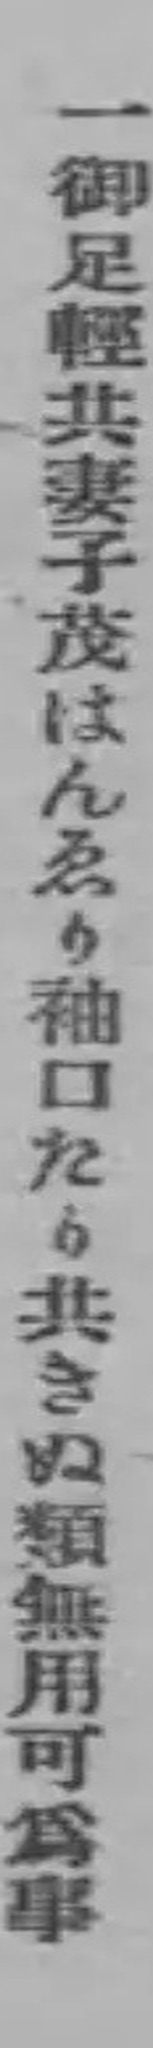一御足軽共妻子茂ははんゑり袖口たり共きぬ類無用可為事
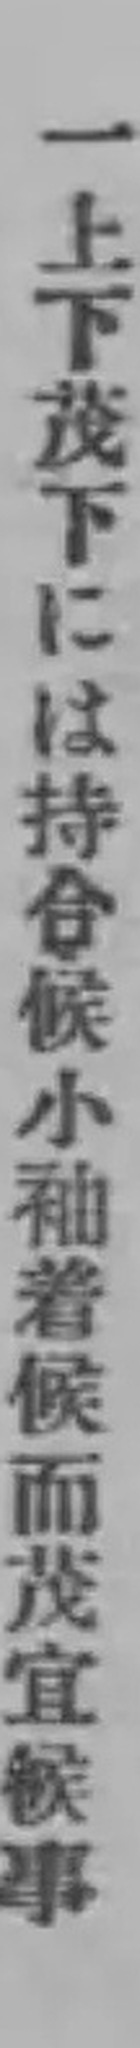一上下茂下には持合候小袖着候而茂宜候事
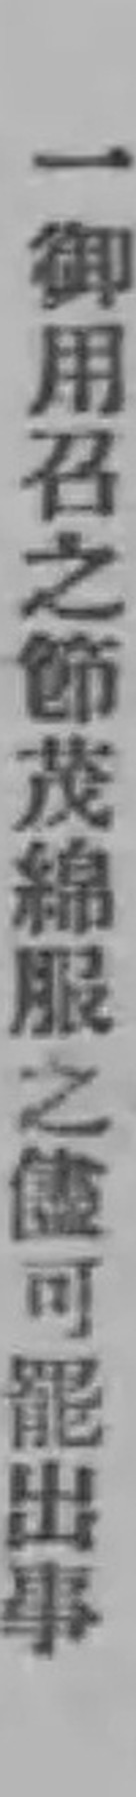一御用召之節茂綿服之侭可罷出事
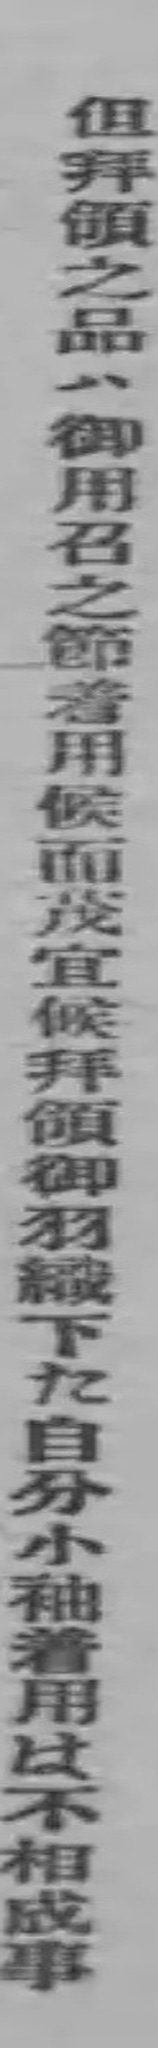但拝領之品ハ御用召之節着用候而茂宜候拝領羽織下た自分小袖着用は不相成事
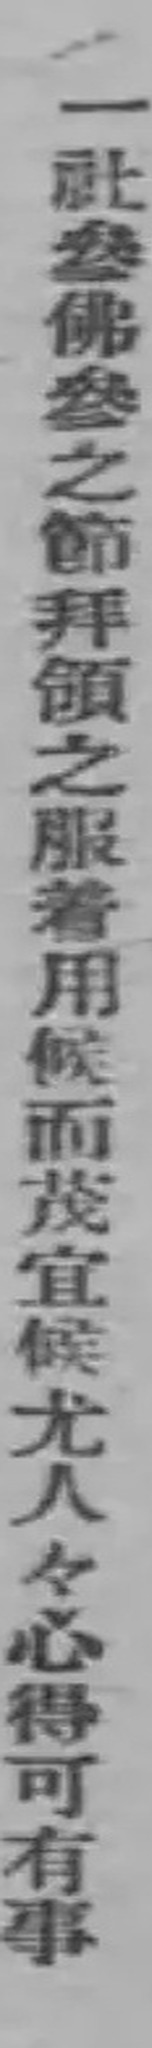一社参仏参之節拝領之服着用候而茂宜候尤人々心得可有事
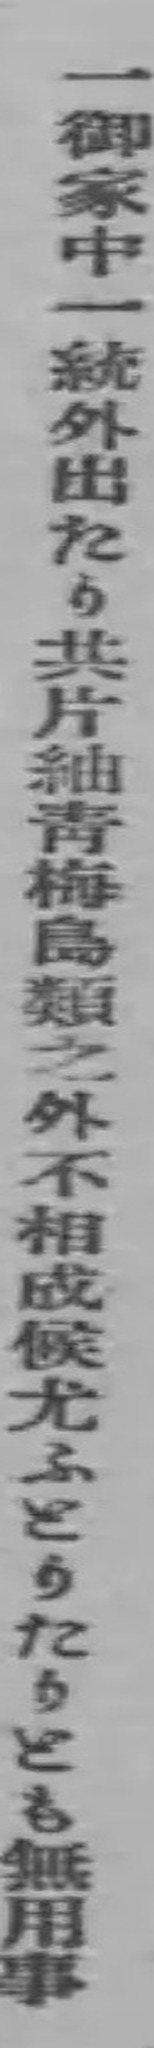一御家中一統外出たり共片袖青梅島類之外不相成候尤ふとりたりとも無用事
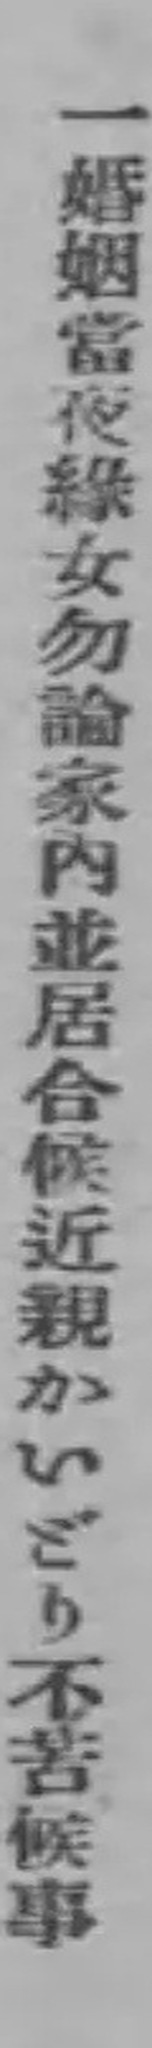一婚姻当夜縁女勿論家内並居合候近親かいどり不苦候事
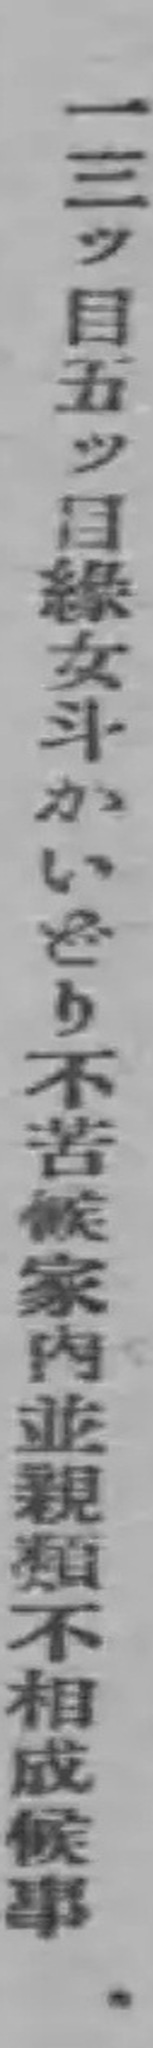一三ツ目五ツ目縁女斗かいどり不苦候家内並親類不相成候事
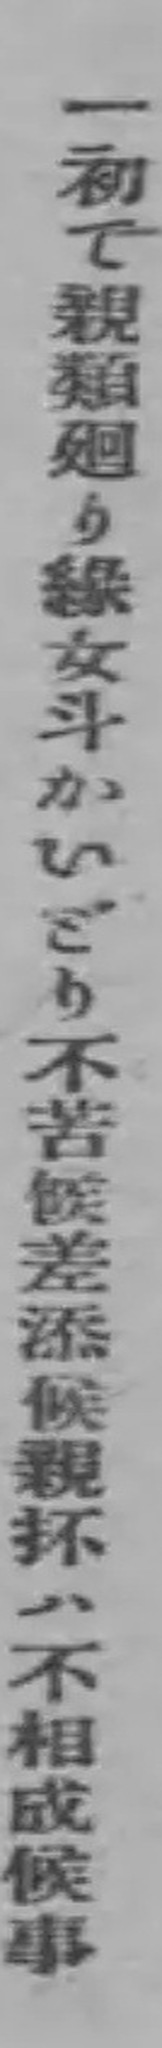一初て親類廻り縁女斗かいどり不苦候差添候親抔ハ不相成候事
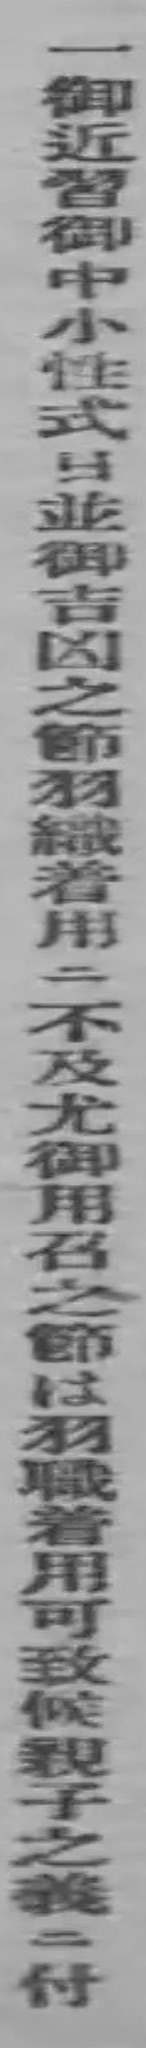一御近習御中小性式日並御吉凶之節羽織着用ニ不及尤御用召之節は羽織着用可致候親子之義ニ付
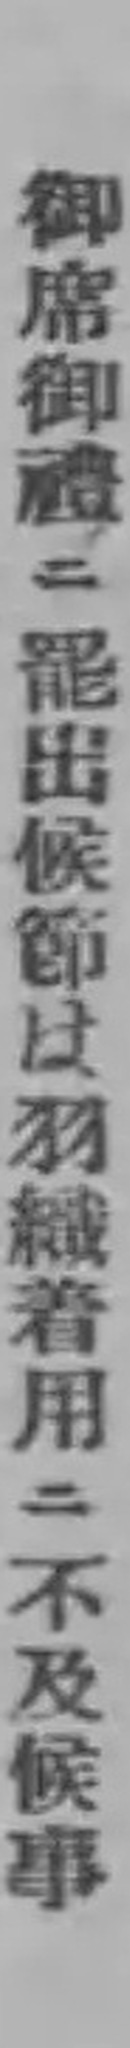御席御礼ニ罷出候節は羽織着用ニ不及候事
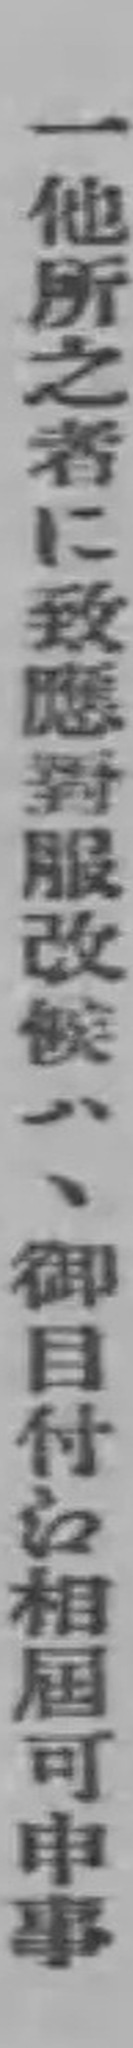一他所之者に致応対服改候ハヽ御目付え相届可申事
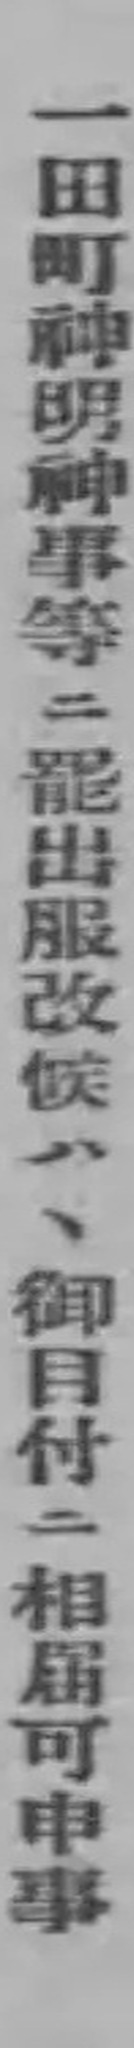一田町神明神事等ニ罷出服改候ハヽ御目付ニ相届可申事
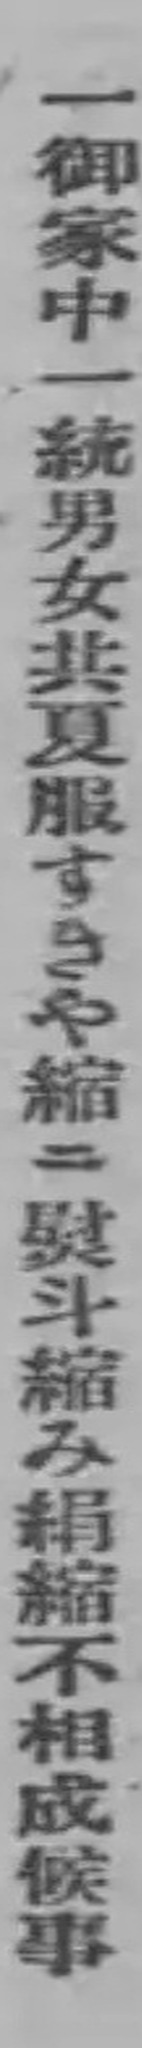一御家中一統男女共夏服すきや縮ニ熨斗縮み絹縮不相成候事
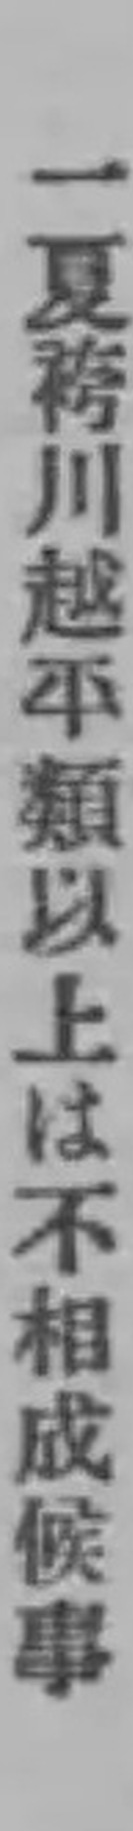一夏袴川越平類以上は不相成候事
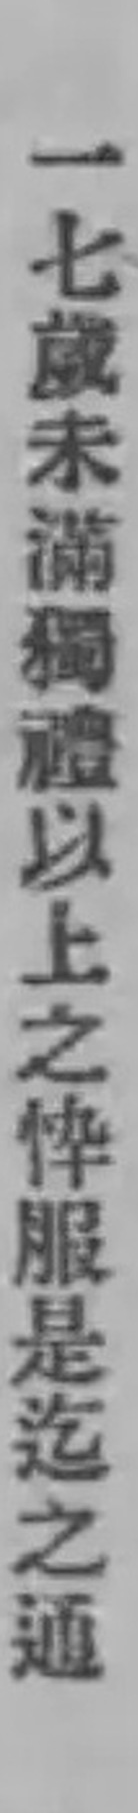一七歳未満独礼以上忰服是迄之通
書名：豊橋市史談
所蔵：国立国会図書館 National Diet Library, JAPAN
